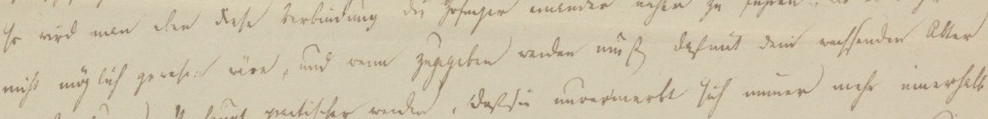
nicht möglich gewesen wäre, und wenn zugegeben werden muß, daß mit dem wachsenden Alter
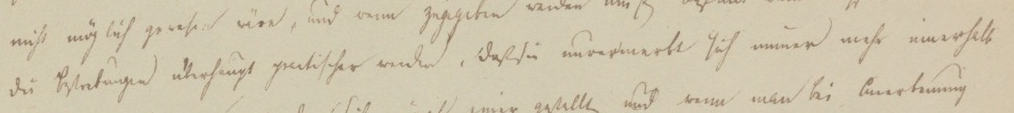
die Bestrebungen überhaupt practischer werden, daß sie unvermerkt sich immer mehr innerhalb
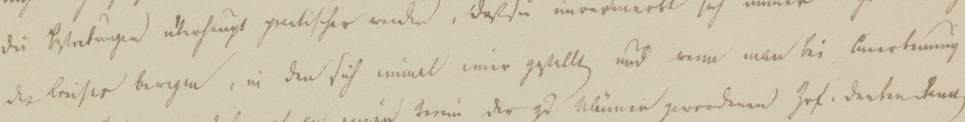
des Kreises bewegen, in den sich einmal einer gestellt, und wenn man bei Anerkennung
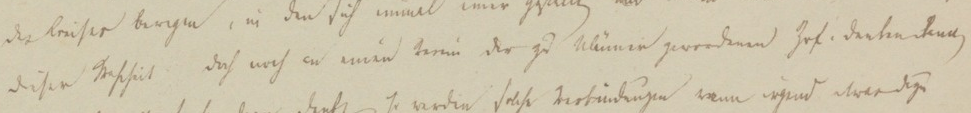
dieser Wahrheit doch noch an einen Verein der zu Männer gewordenen Zof. denken kann,
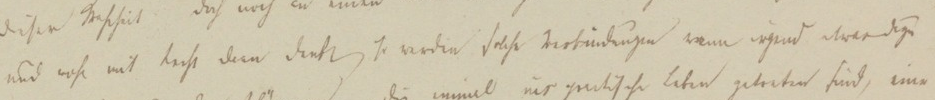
und noch mit Recht daran denkt, so werden solche Verbindungen wenn irgend etwas dazu
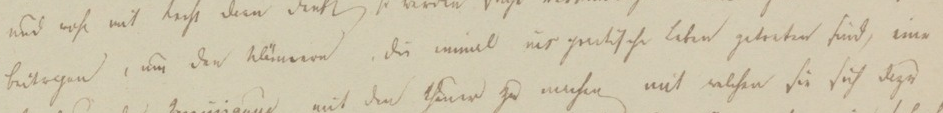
beitragen, um den Männern, die einmal ins practische Leben getreten sind, eine
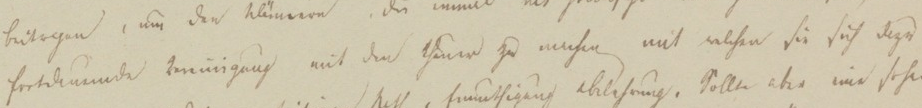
fortdauernde Vereinigung mit denen theuer zu machen, mit welchen sie sich dazu
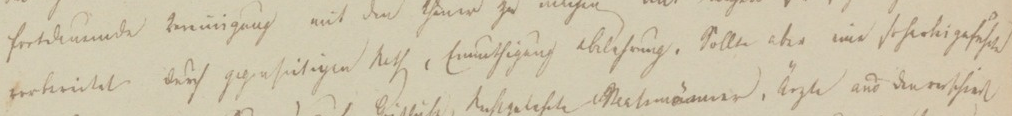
vorbereitet durch gegenseitigen Rath, Ermuthigung & Belehrung. Sollte aber eine so herbeigeführte
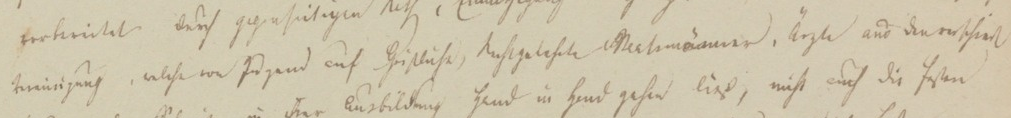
Vereinigung, welche von Jugend auf Geistliche, Rechtgelehrte, Staatsmänner, Ärzte aus den verschieden
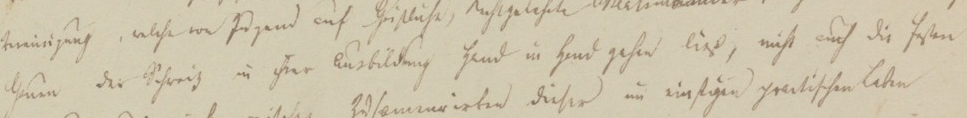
Gauen der Schweiz in ihrer Ausbildung Hand in Hand gehen ließ, nicht auch die festen
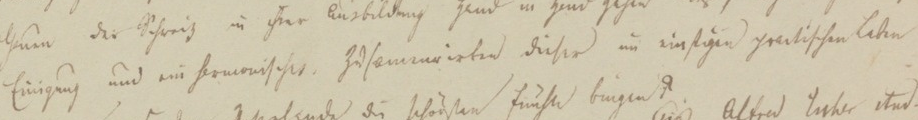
Einigung und ein harmonisches Zusammenwirken dieser im einstigen practischen Leben
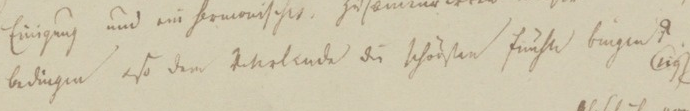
bedingen & so dem Vaterlande die schönsten Früchte bringen?
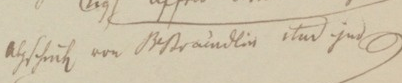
Abschrift von Be Brändlin stud. jur.
